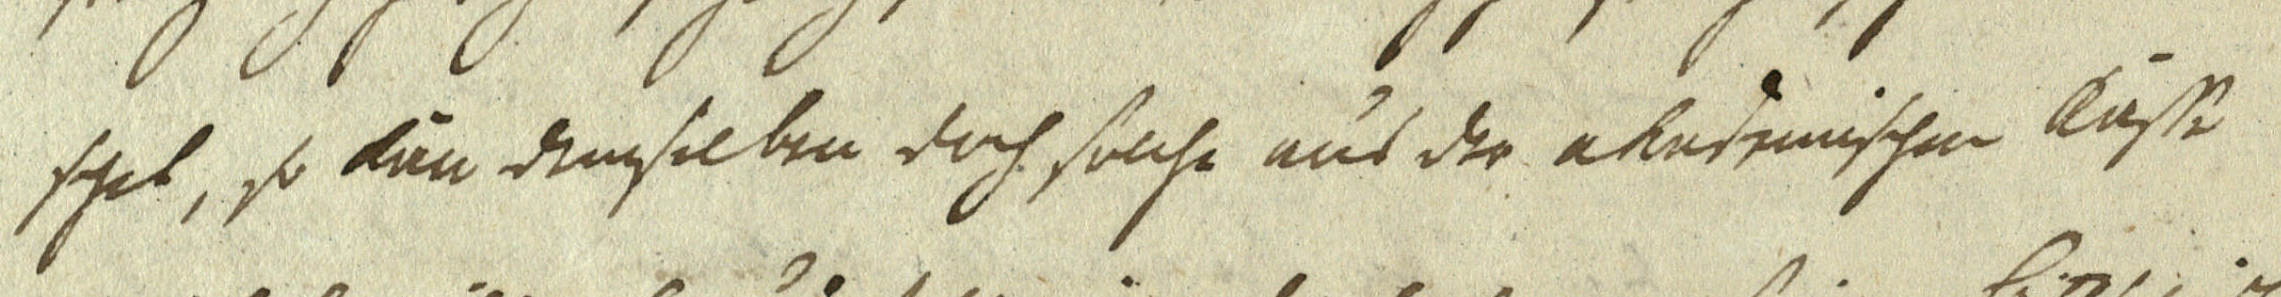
schet, so kan demselben doch solche aus der akademischen Kasse
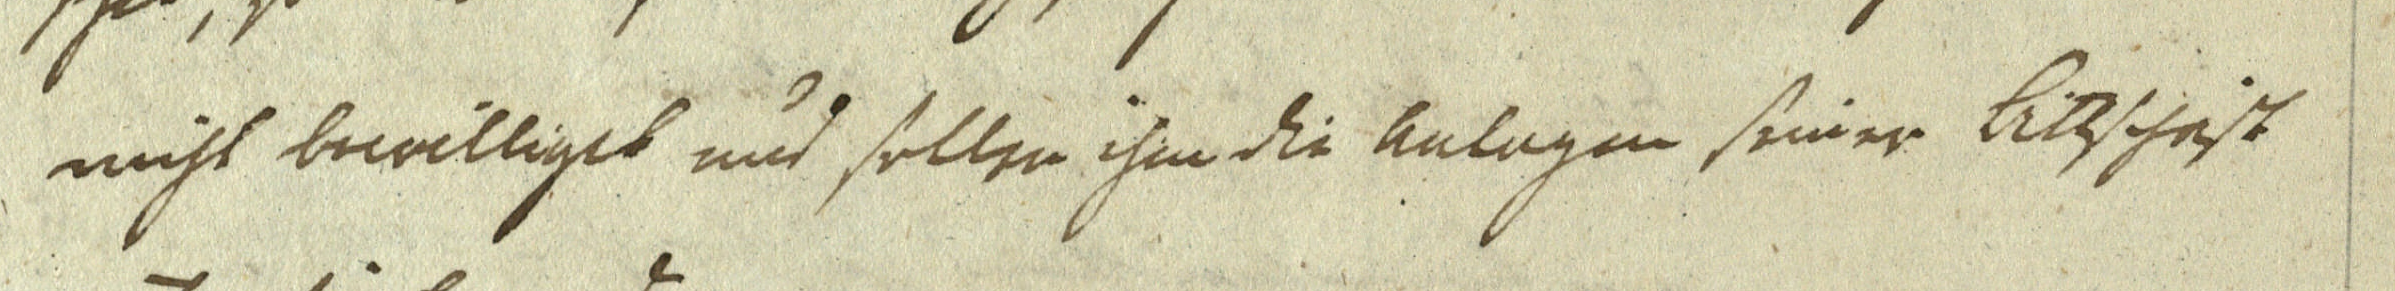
nicht bewilliget und sollen ihm die Anlagen seiner Bittschrift
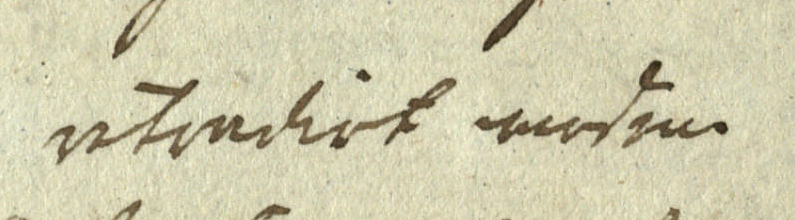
retradirt werden.
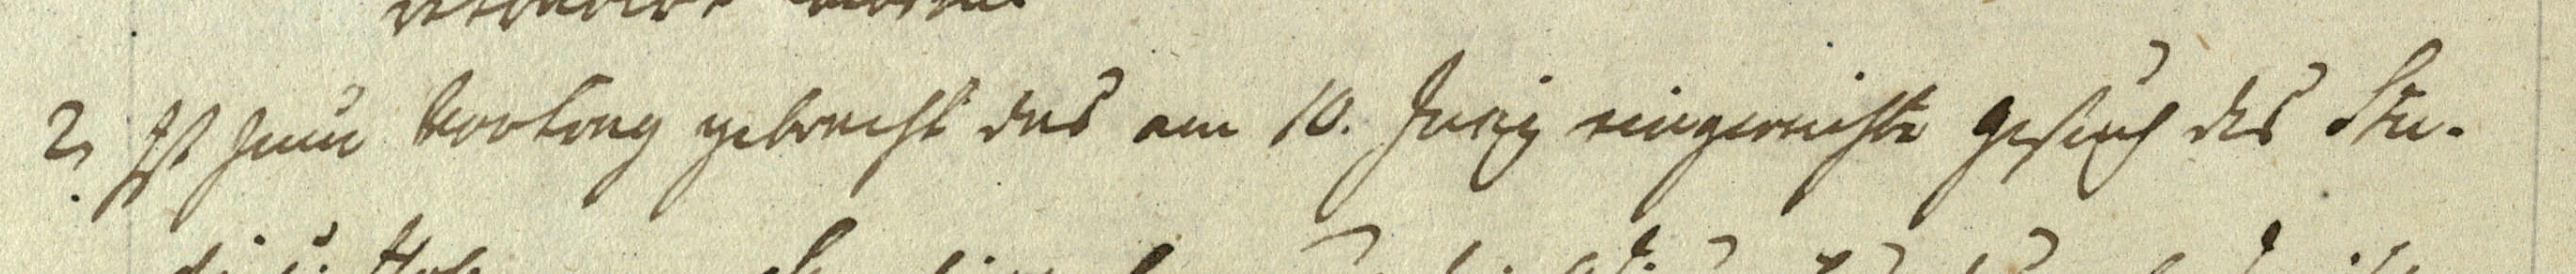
2. Ist zum Vortrag gebracht das am 10. Junÿ eingereichte Gesuch des Stu¬
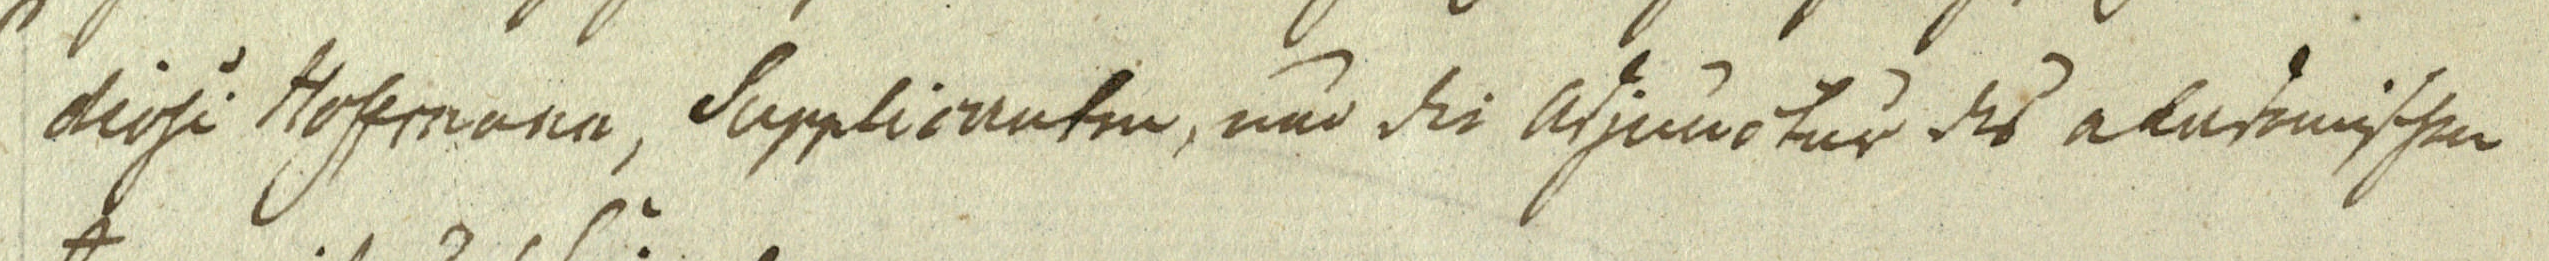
diosi Hoffmann, Supplicanten, um die Adjunctur des akademischen
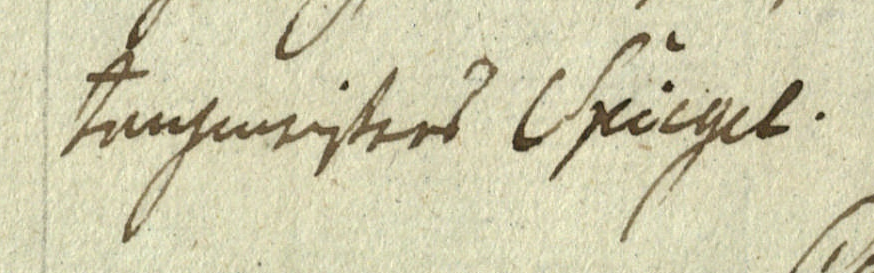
Tanzmeisters Spiegel.
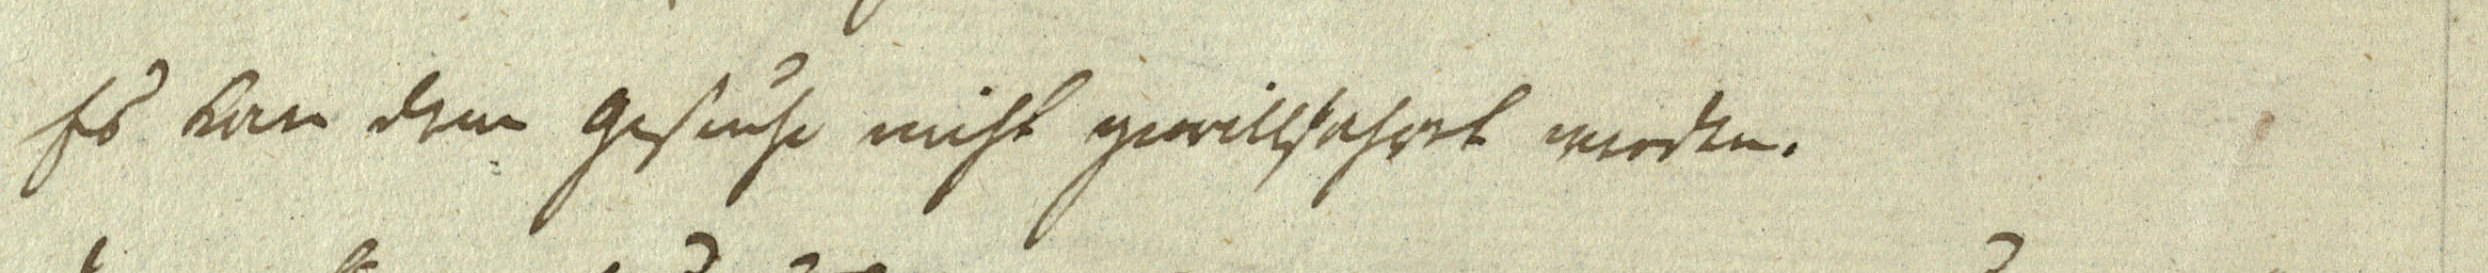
Es kan dem Gesuch nicht gewillfahret werden.
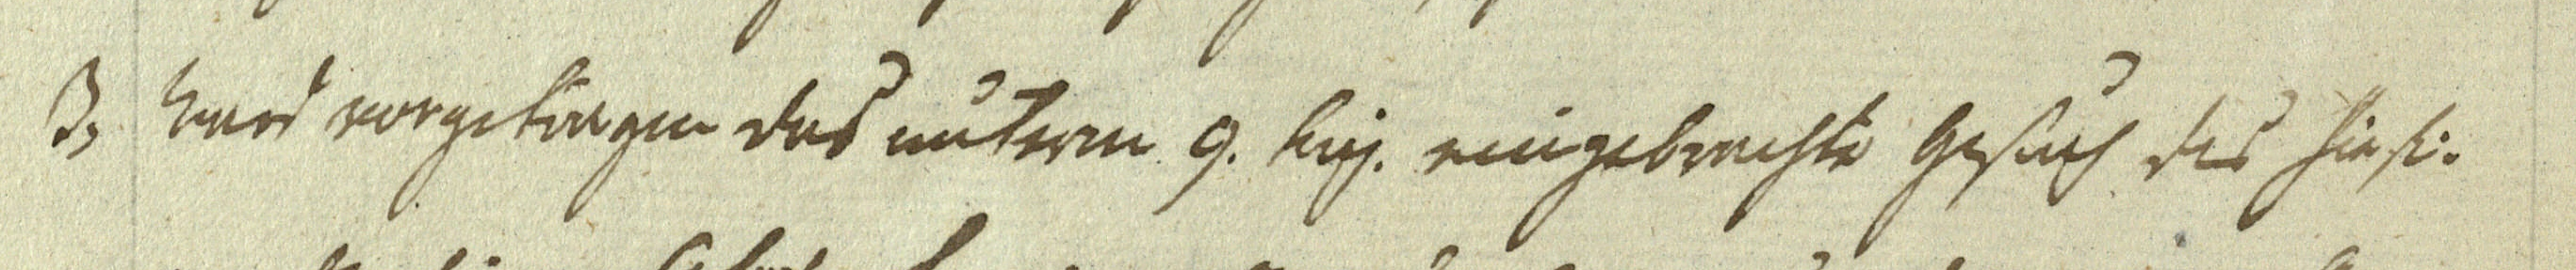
3. Ward vorgetragen das unterm 9. huj. eingebrachte Gesuch des hiesi¬
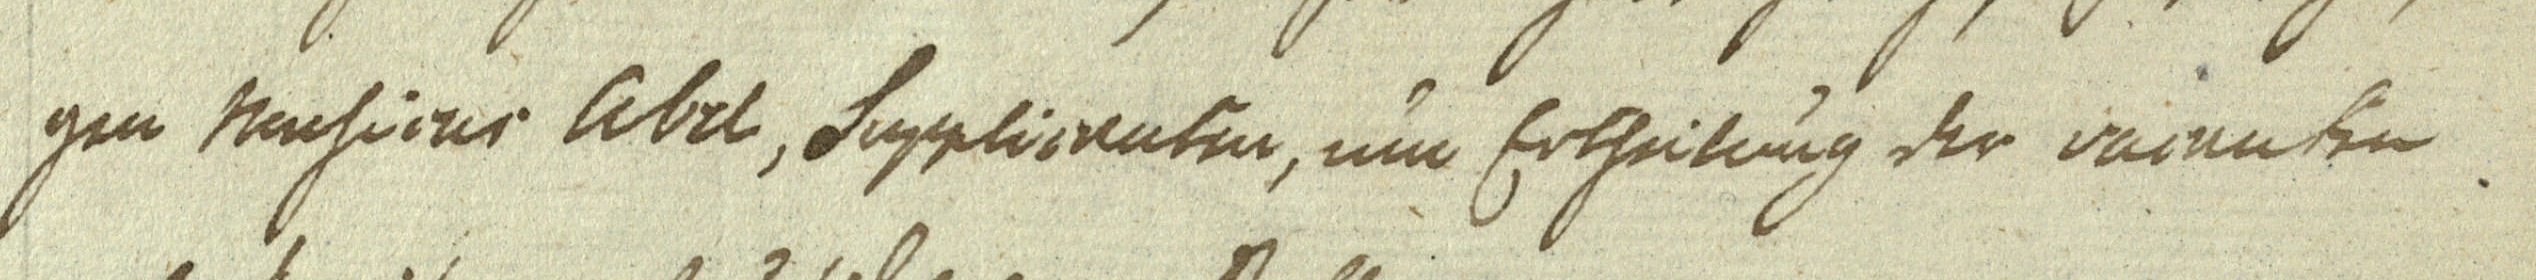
gen Musicus Abel, Supplicanten, um Ertheilung der vacanten
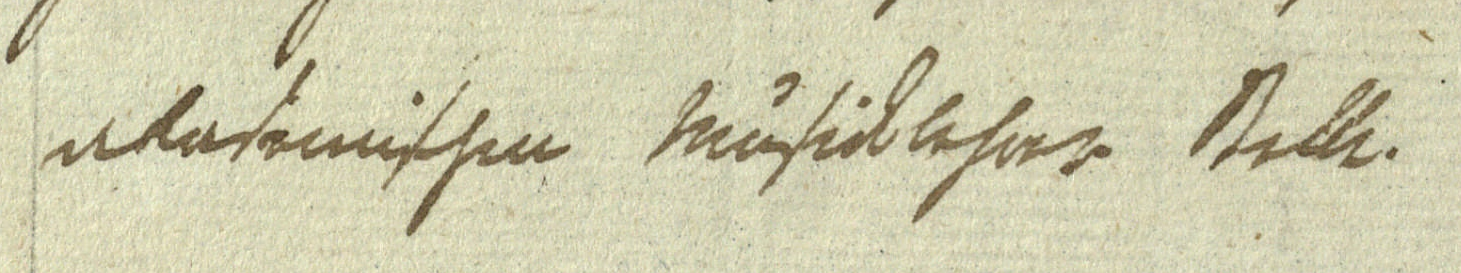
akademischen Musiklehrer Stelle.
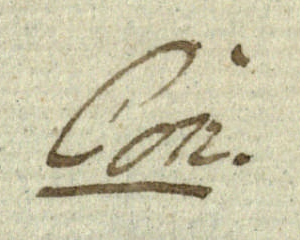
Con.
